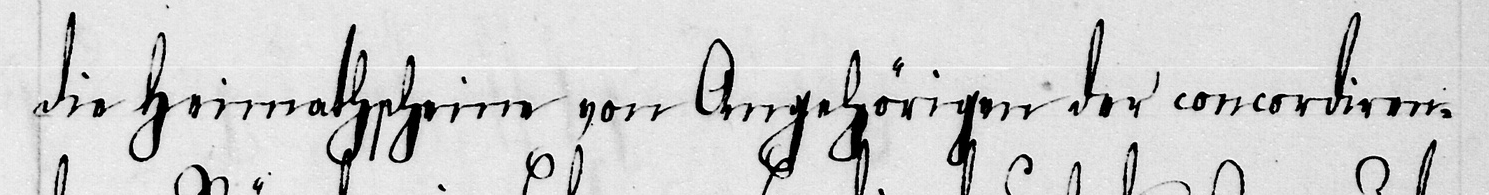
die Heimathscheine von Angehörigen der concordiren¬
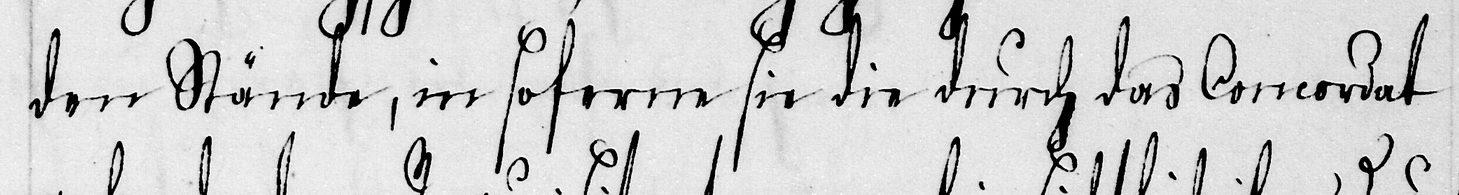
den Stände, in soferne sie die durch das Concordat
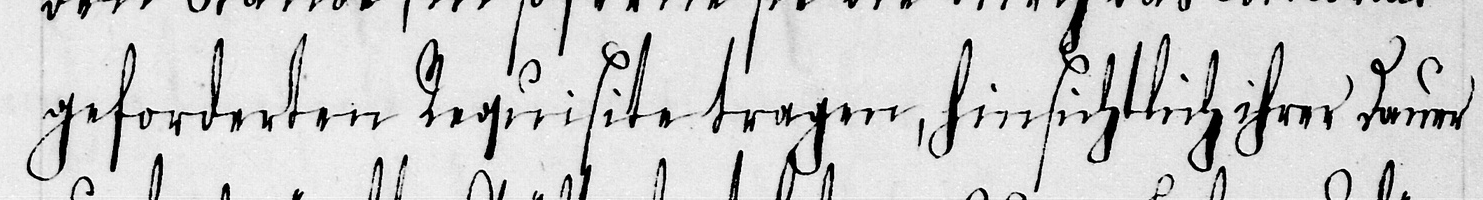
geforderten Requisite tragen, hinsichtlich ihrer
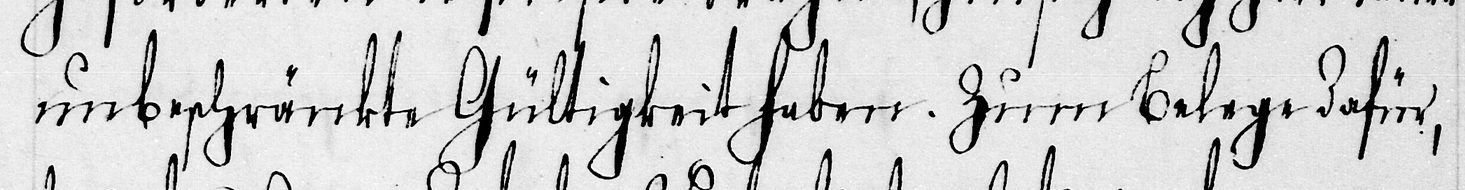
unbeschränkte Gültigkeit haben. Zum Belege dafür,
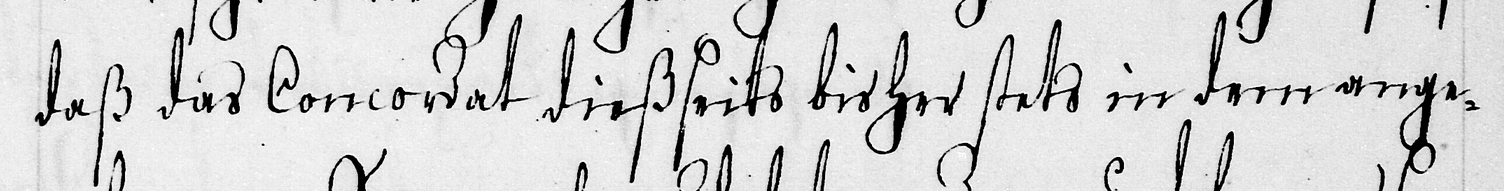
daß das Concordat dießseits bisher stets in dem ange¬
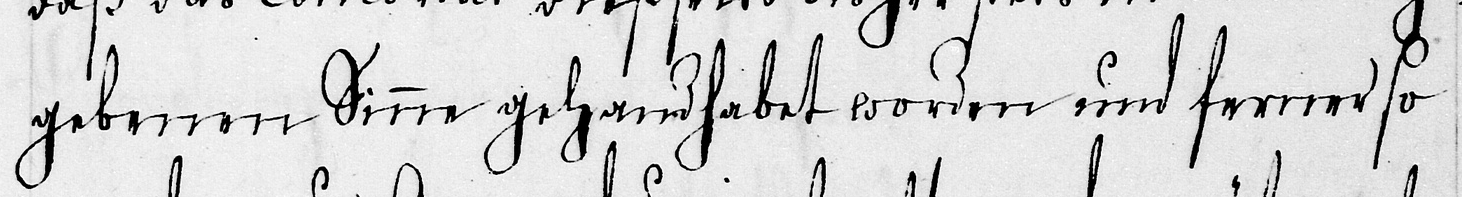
gebenen Sinne gehandhabet worden und ferner so
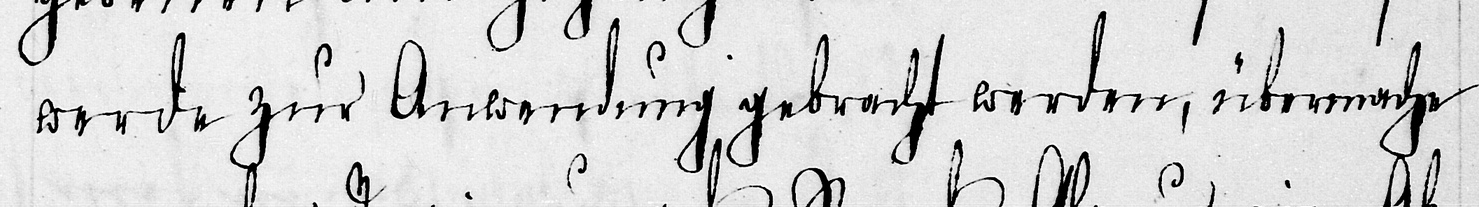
werde zur Anwendung gebracht werden, übermache
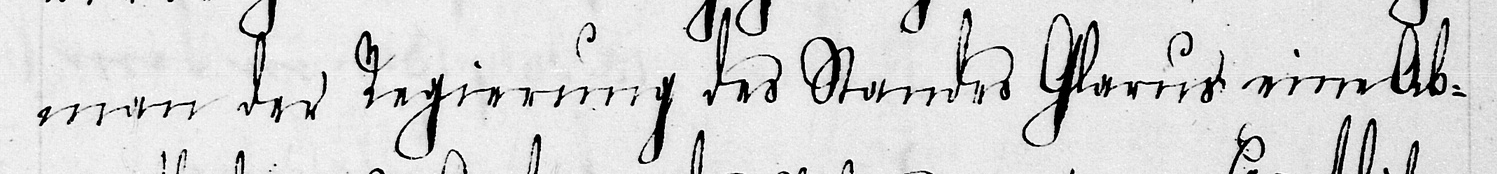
man der Regierung des Standes Glarus eine Ab¬
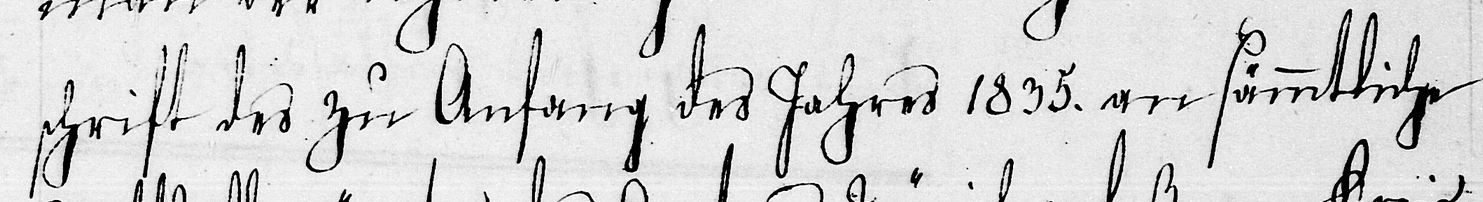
schrift des zu Anfang des Jahre 1835. an sämmtliche
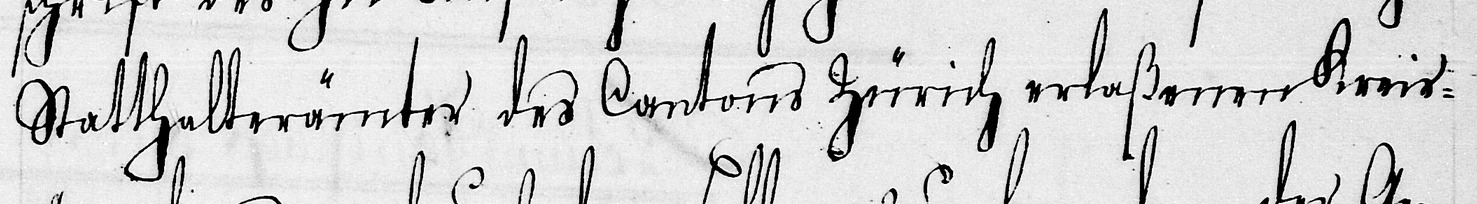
Statthalterämter des Cantons Zürich erlaßenen Kreis¬
